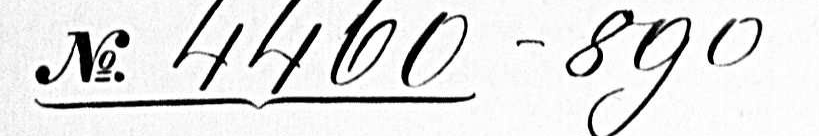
No. 4460 - 890
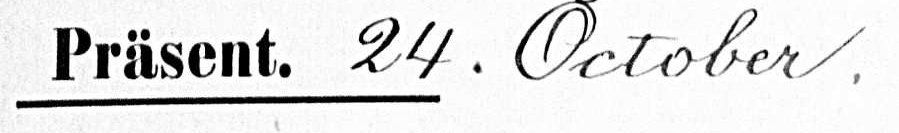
Präsent. 24. October.
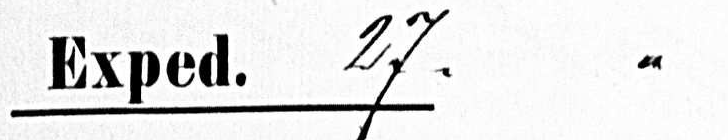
Exped. 27. October.
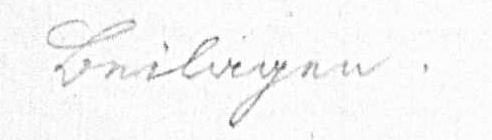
Beilagen.
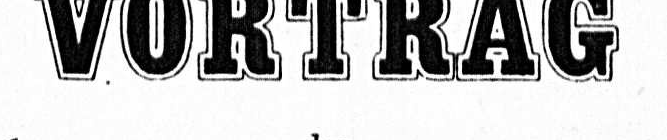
Vortrag
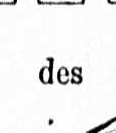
des
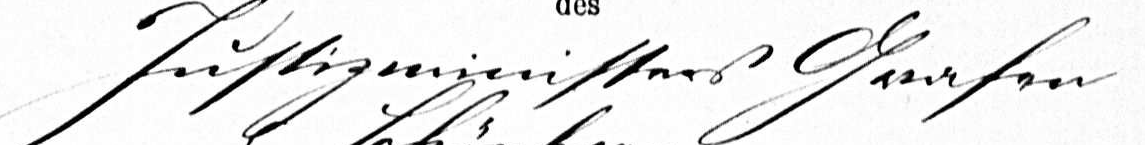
Justizministers Grafe
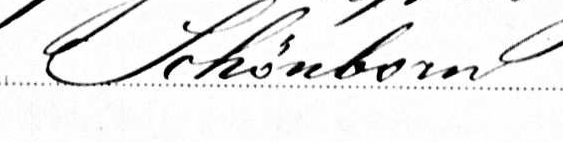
Schönborn
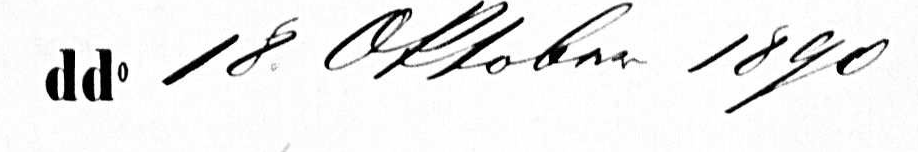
ddo 18. Oktober 1890
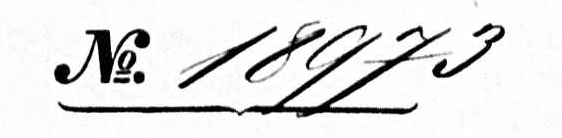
No. 18973
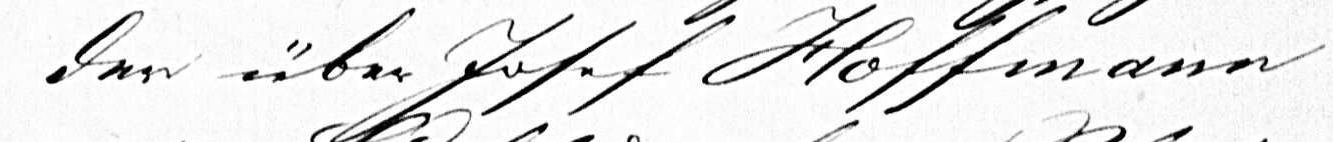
der über Josef Hoffmann
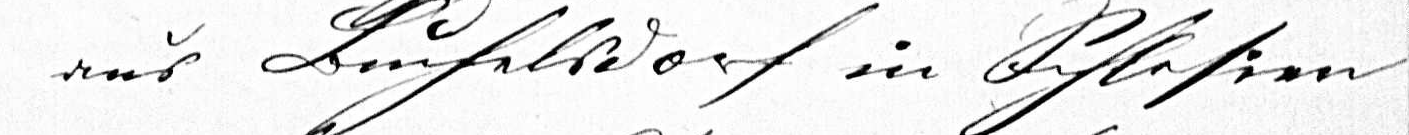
aus Buchelsdorf in Schlesien
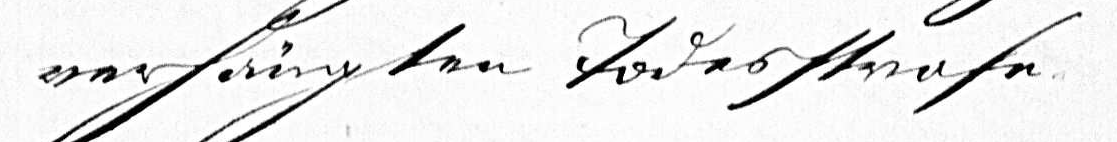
verhängten Todesstrafe
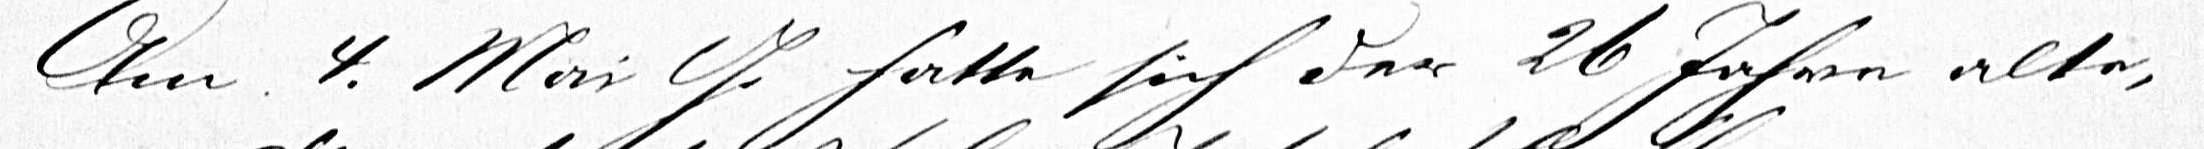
Am 4. Mai G. hatte sich der 26 Jahre alte,
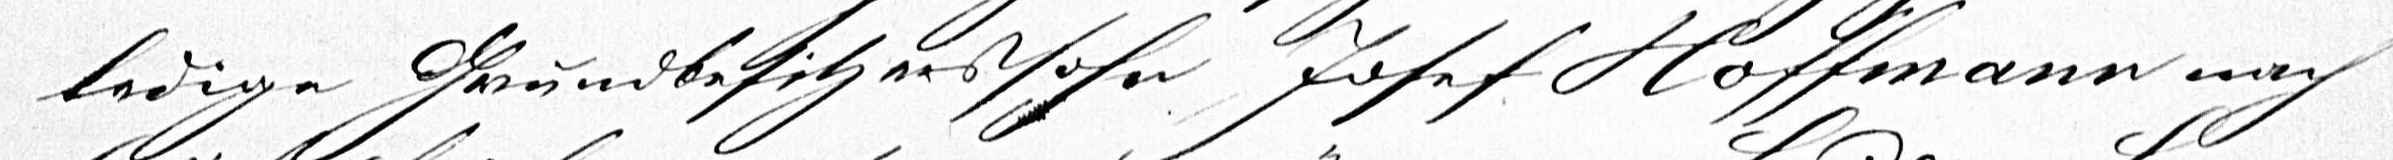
ledige Grundbesitzerssohn Josef Hoffmann nach
